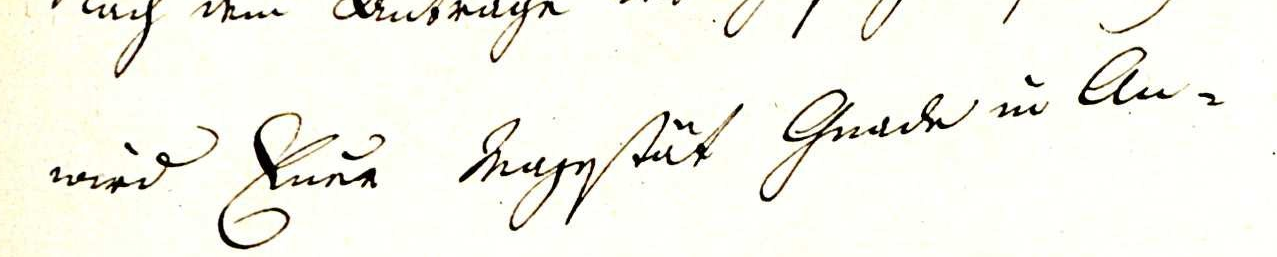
wird Euer Majestät Gnade in An¬
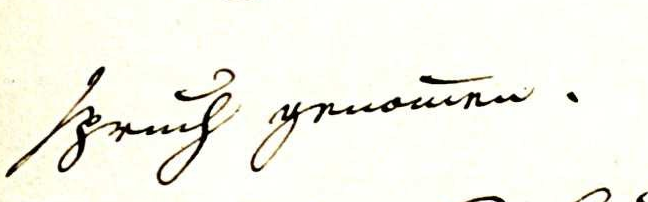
spruch genommen.
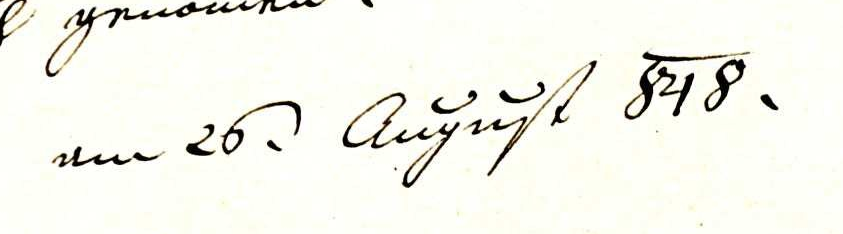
am 26. August [1]848
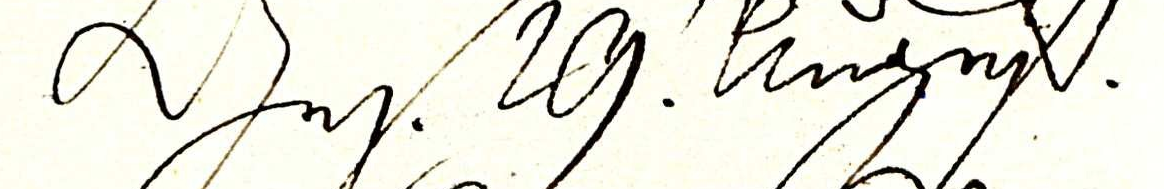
Ges. 29. August
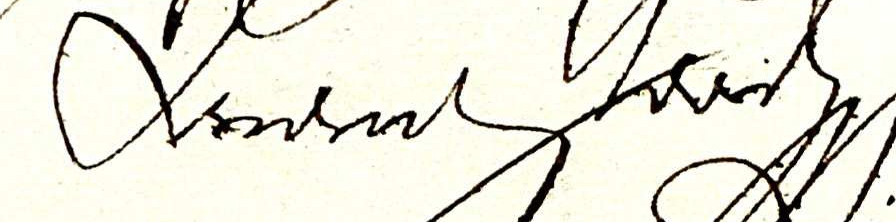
Franz Karl
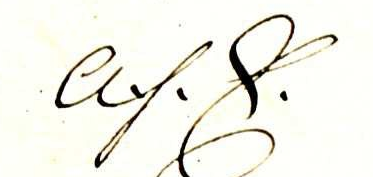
Ah.E.
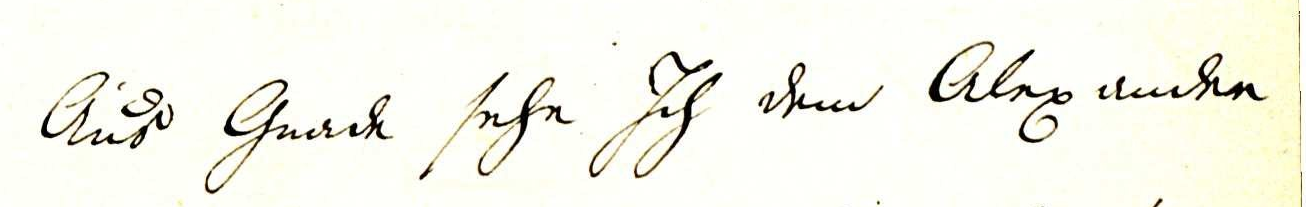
Aus Gnade sehe Ich dem Alexander
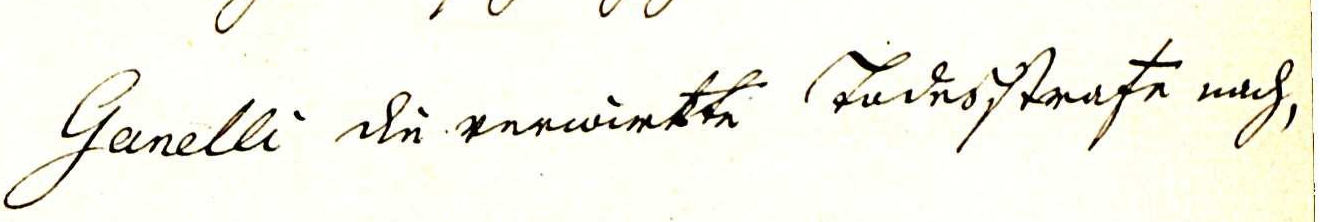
Ganelli die verwirkte Todesstrafe nach
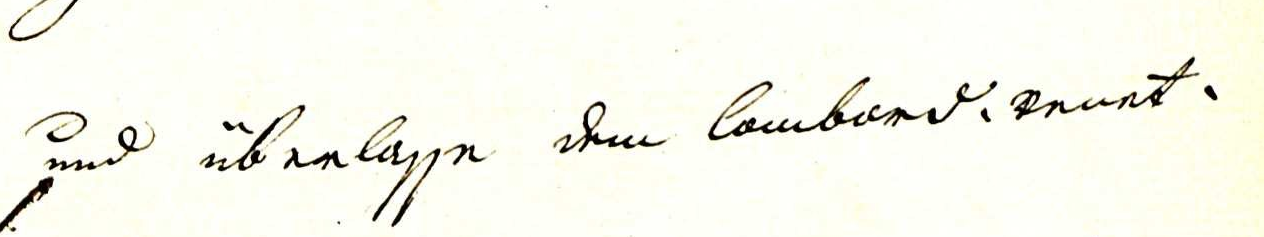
und überlasse dem lombar. venet. Justiz-
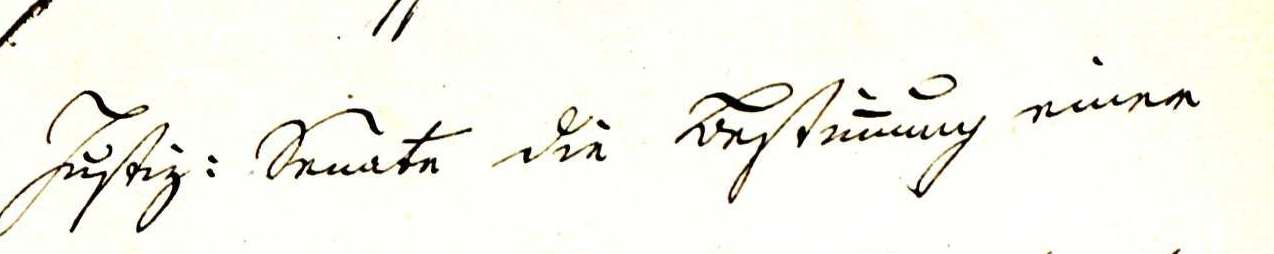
Senate die Bestimmung einer
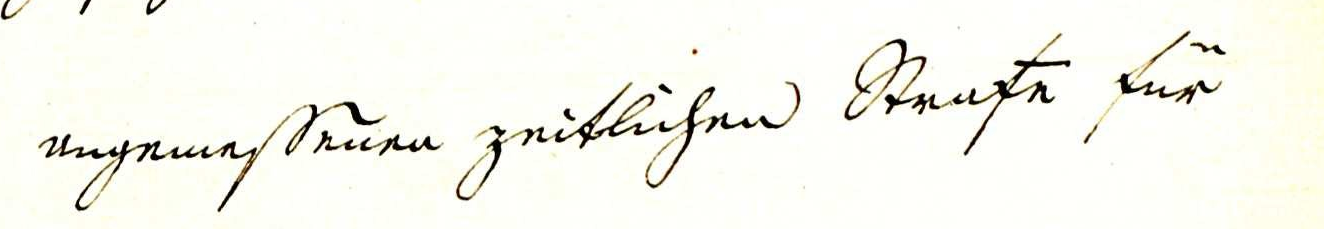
angemeßenen zeitlichen Strafe für
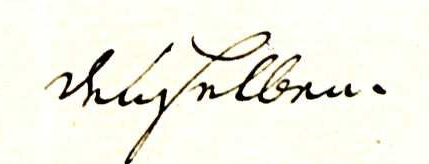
denselben.
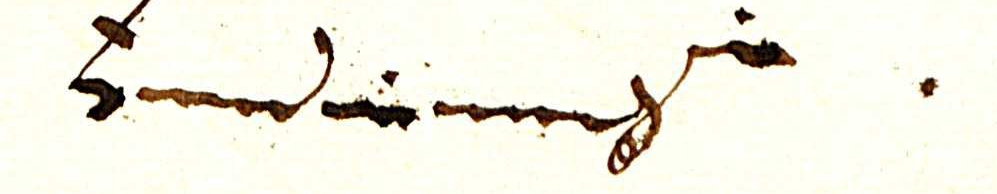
Ferdinand
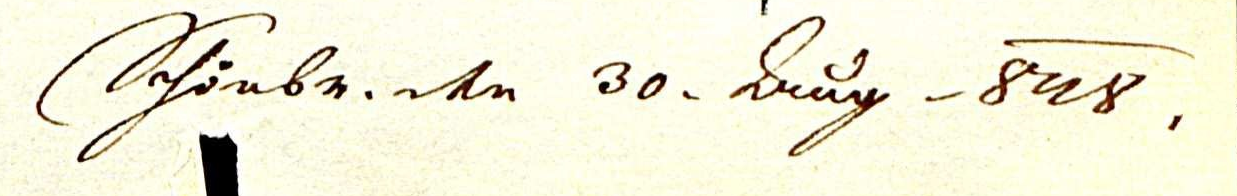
Schönbrunn den 30. August 848
